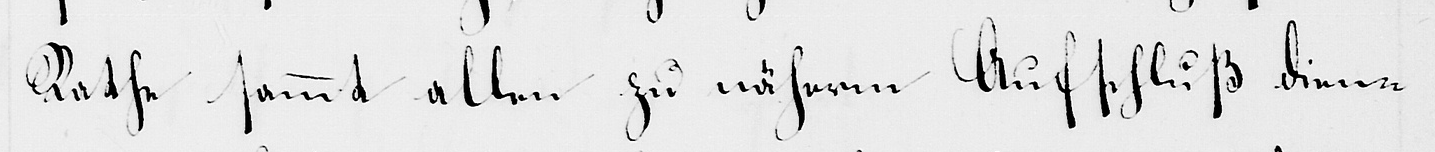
Rathe sammt allen zu näherm Aufschluß dien¬
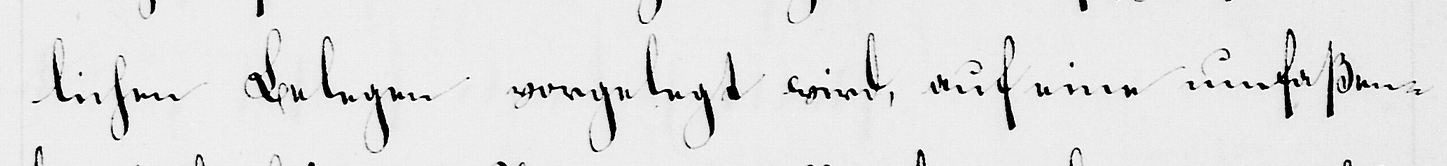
lichen Belegen vorgelegt wird, auf eine umfaßen¬
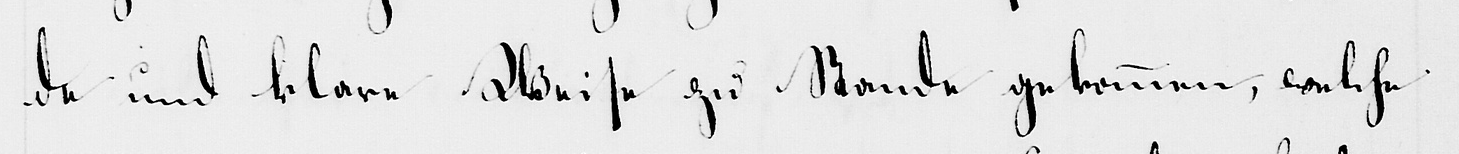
de und klare Weise zu Stande gekommen, welche
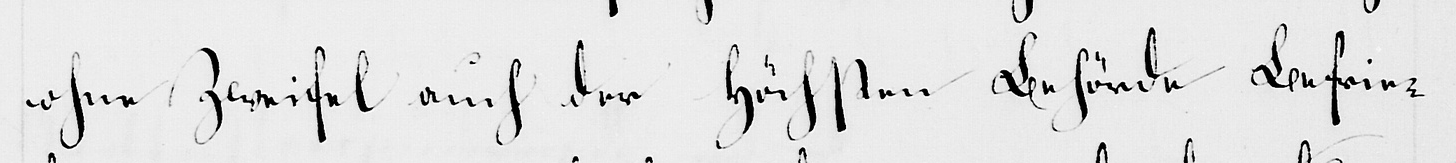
ohne Zweifel auch der Höchsten Behörde Befrie¬
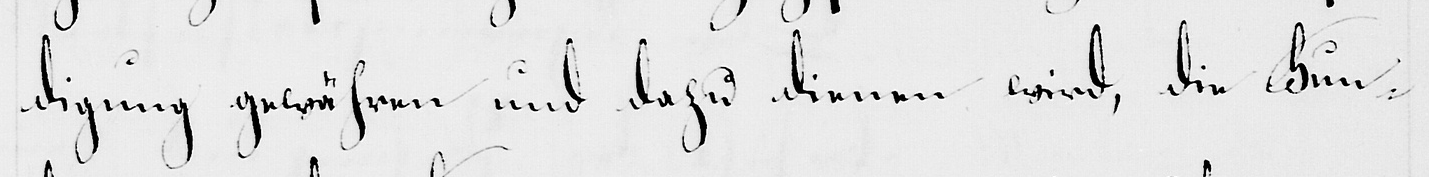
digung gewähren und dazu dienen wird, die Fun¬
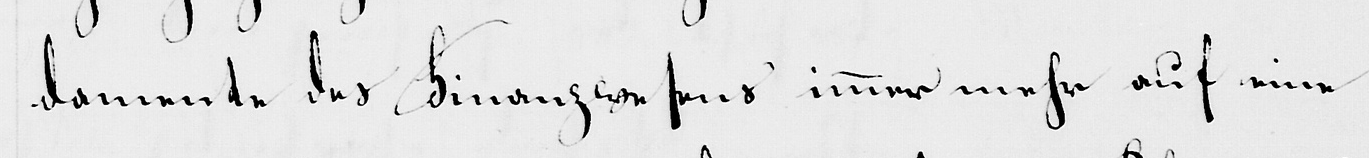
damente des Finanzwesens immer mehr auf eine
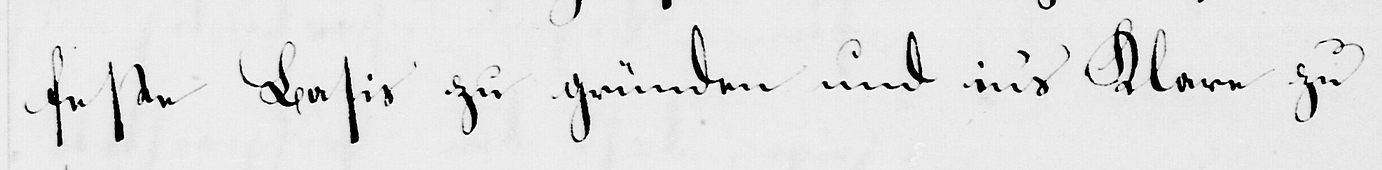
feste Basis zu gründen und in’s Klare zu
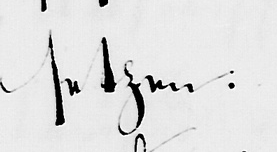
setzen.
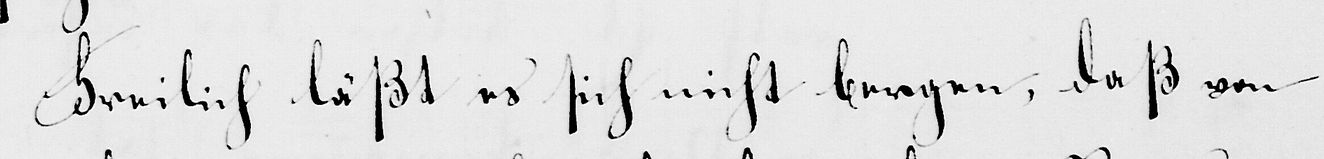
Freilich läßt es sich nicht bergen, daß von
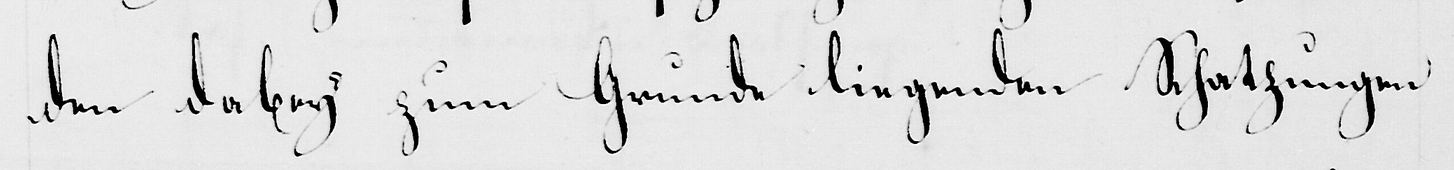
den dabey zum Grunde liegenden Schatzungen
